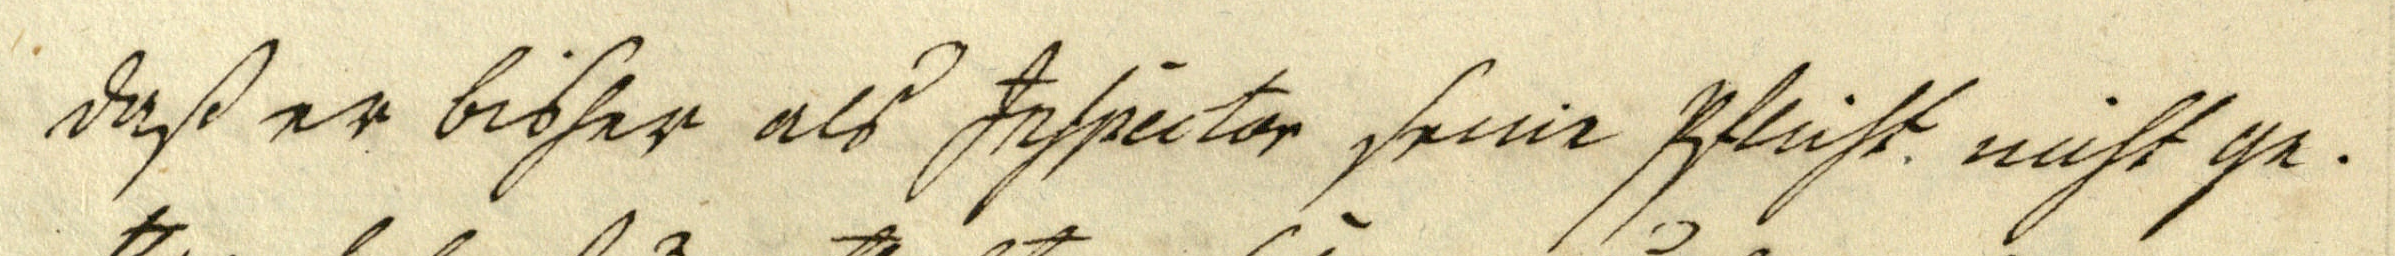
daß er bisher als Inspector seine Pflicht nicht ge-
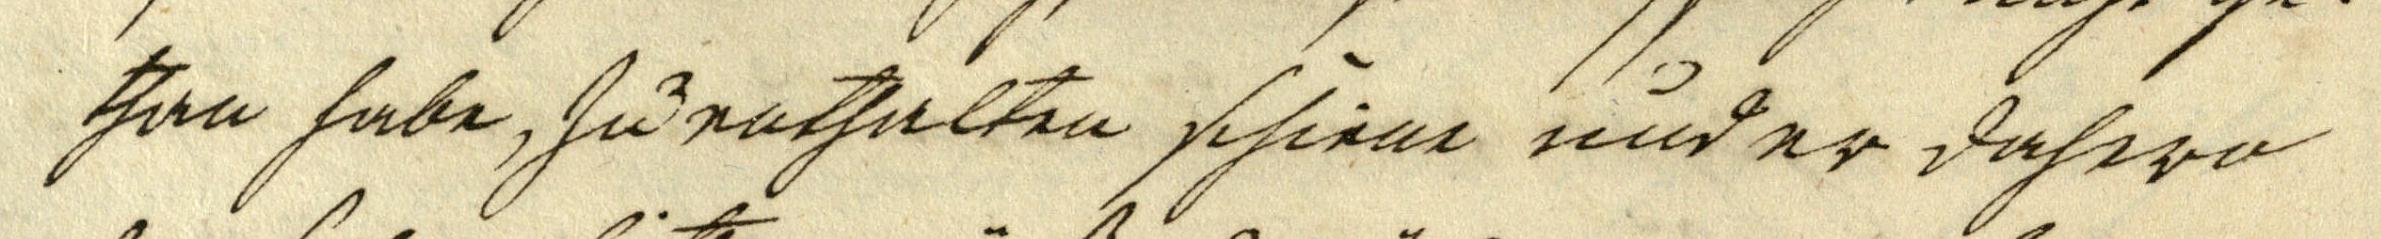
than habe, zu enthalten schiene und er dahero
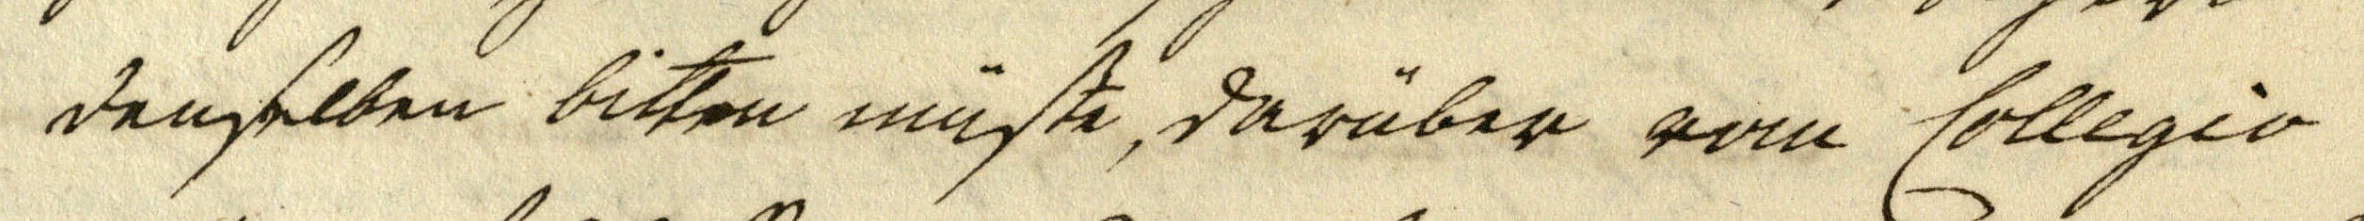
denselben bitten müßte, darüber vom Collegio
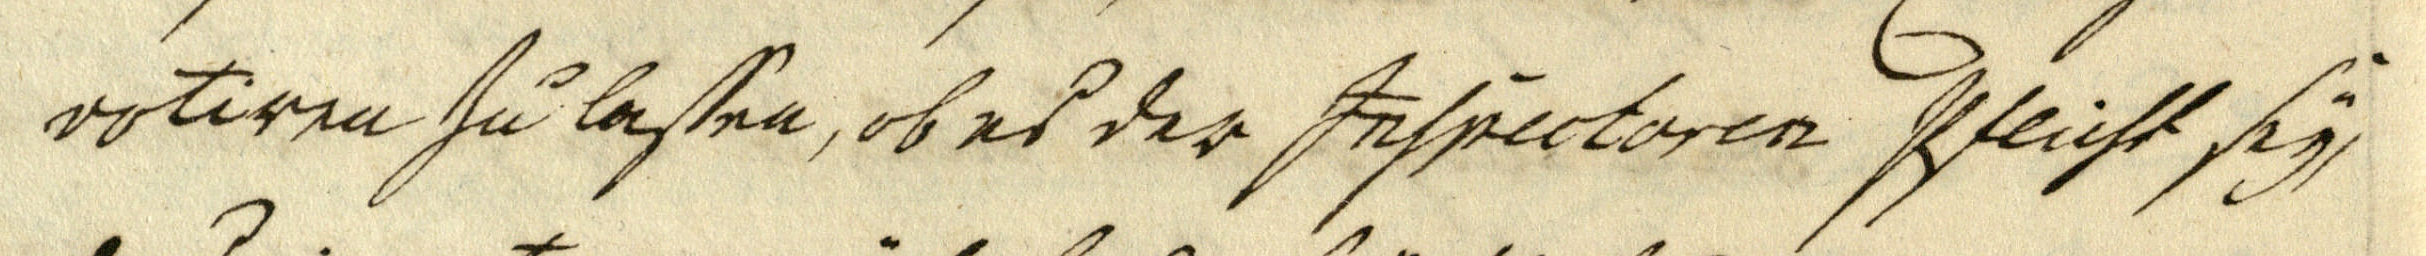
votiren zu lassen, ob es der Inspectoren Pflicht sey,
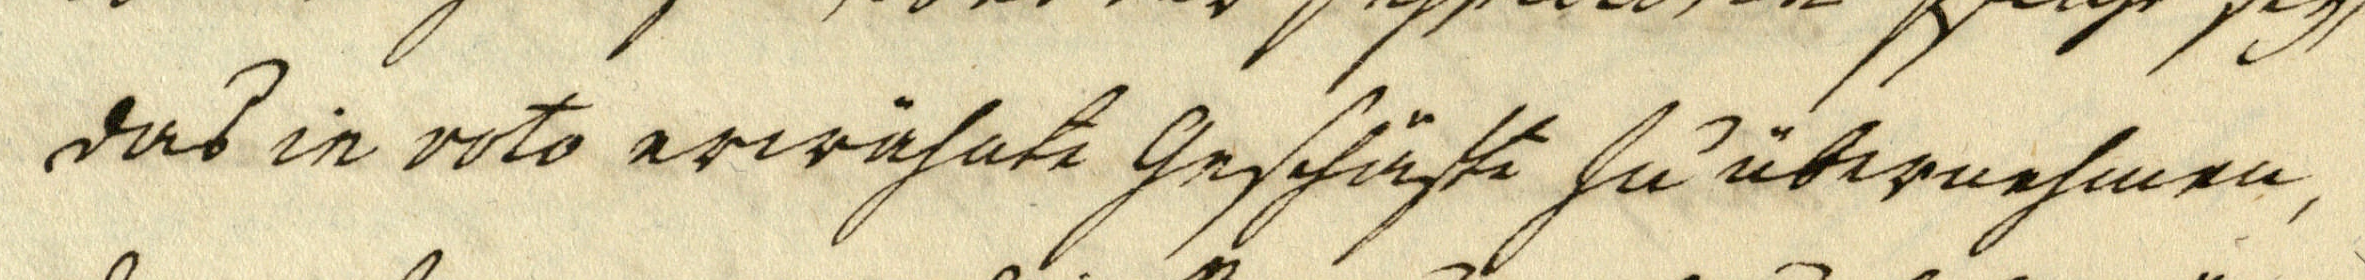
das in voto erwähnte Geschäfte zu übernehmen,
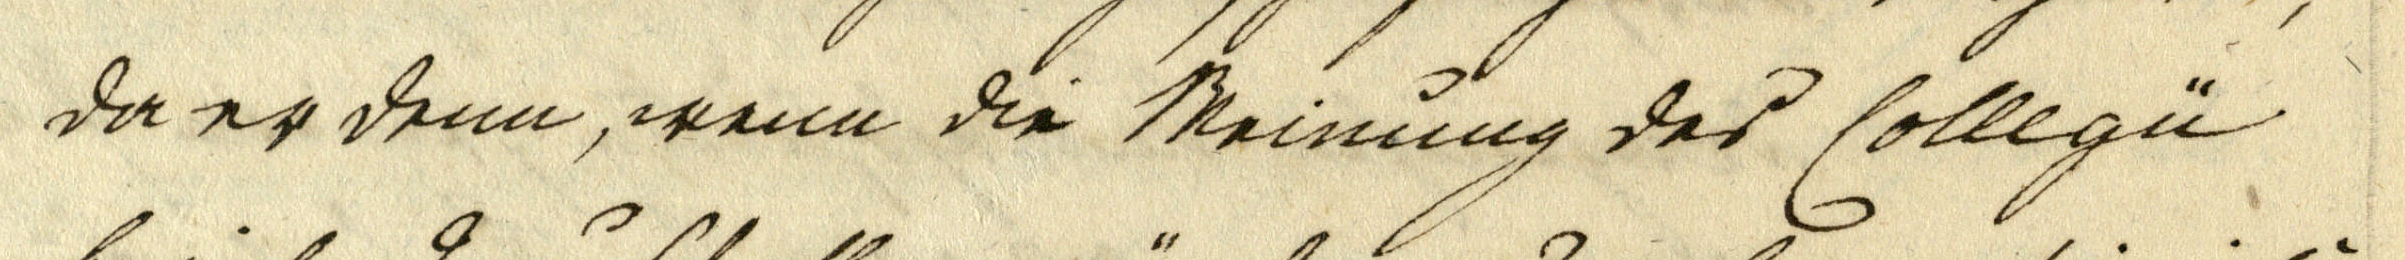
da er denn, wenn die Meinung des collegii
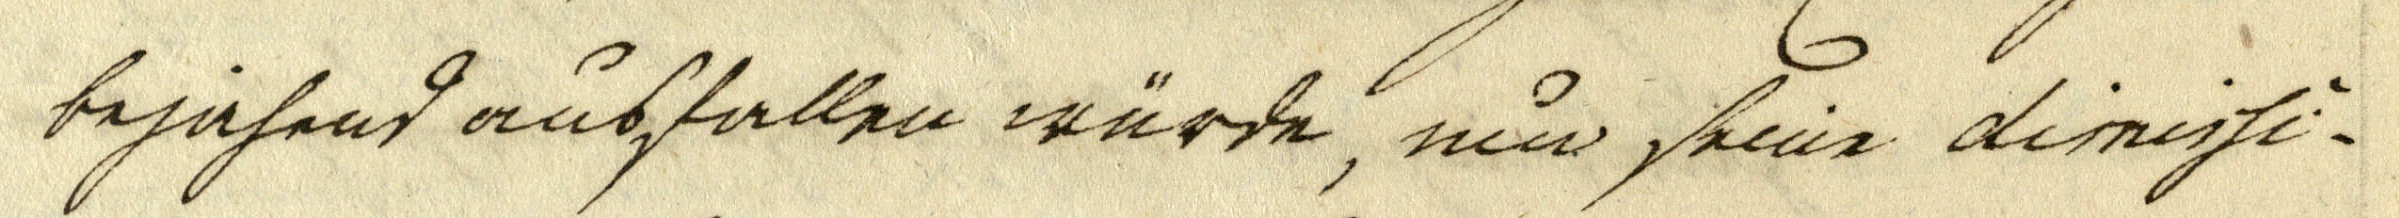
bejahend ausfallen würde, um seine dimissi-
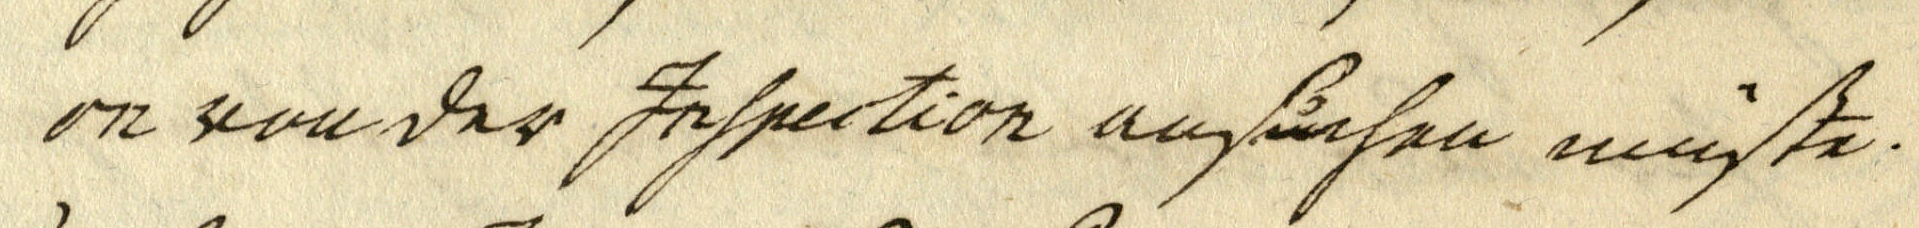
on von der Inspection ansuchen müßte.
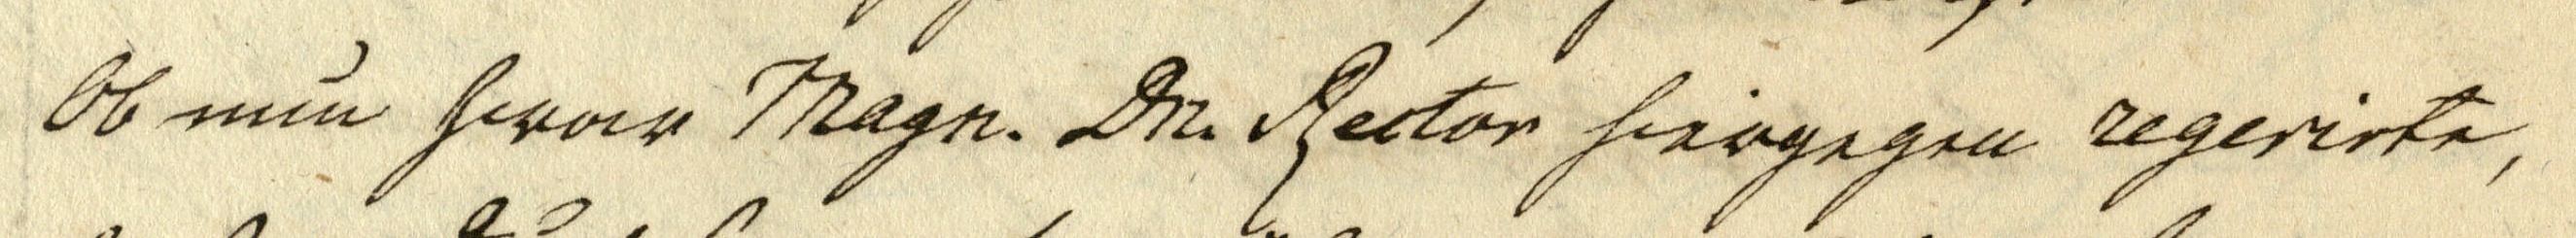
Ob nun zwar Magn. Dn. Rector hiergegen regerirte,
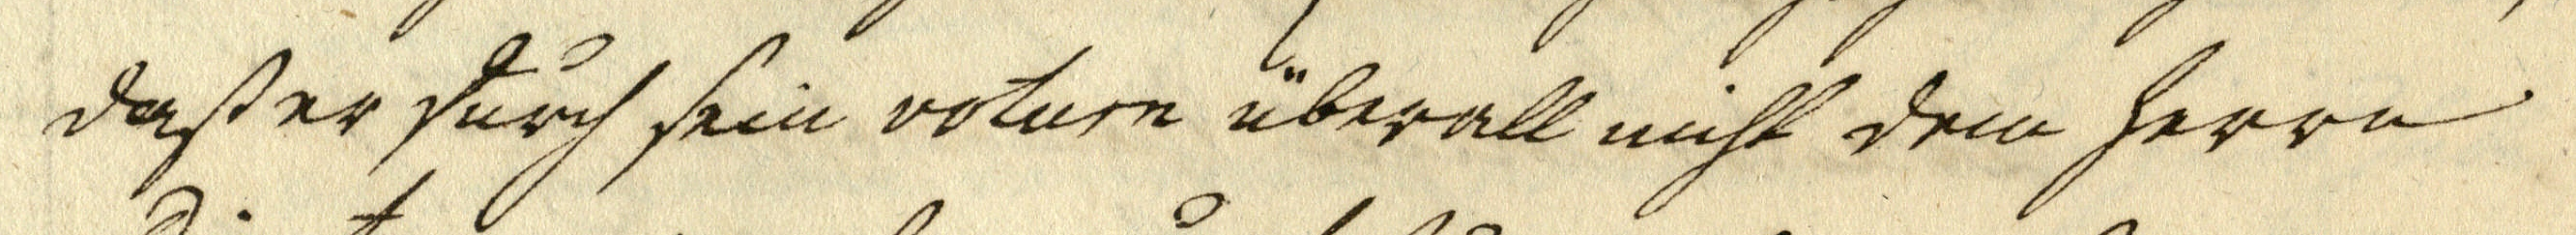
daß er durch sein votum überall nicht dem herrn
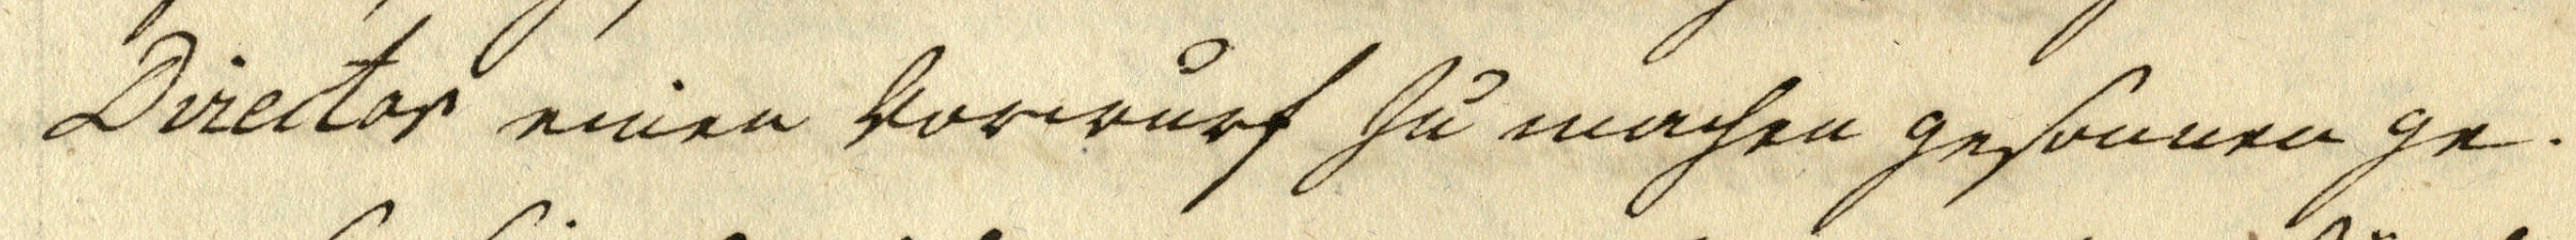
Director einen Vorwurf zu machen gesonnen ge-
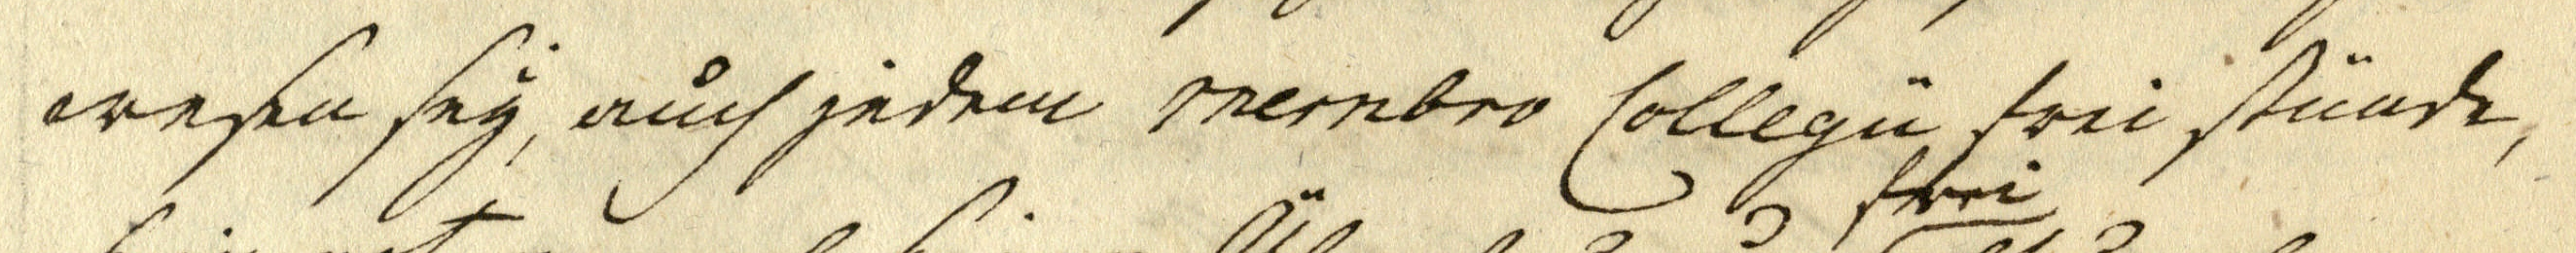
wesen sey, auch jedem membro Collegii frei stünde,
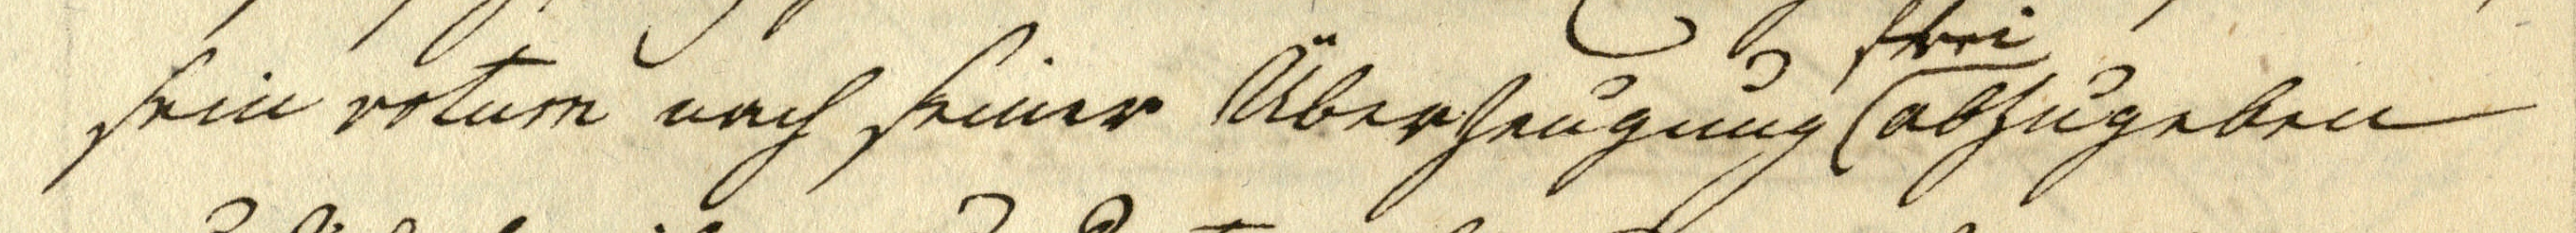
sein votum nach seiner Überzeugung abzugeben
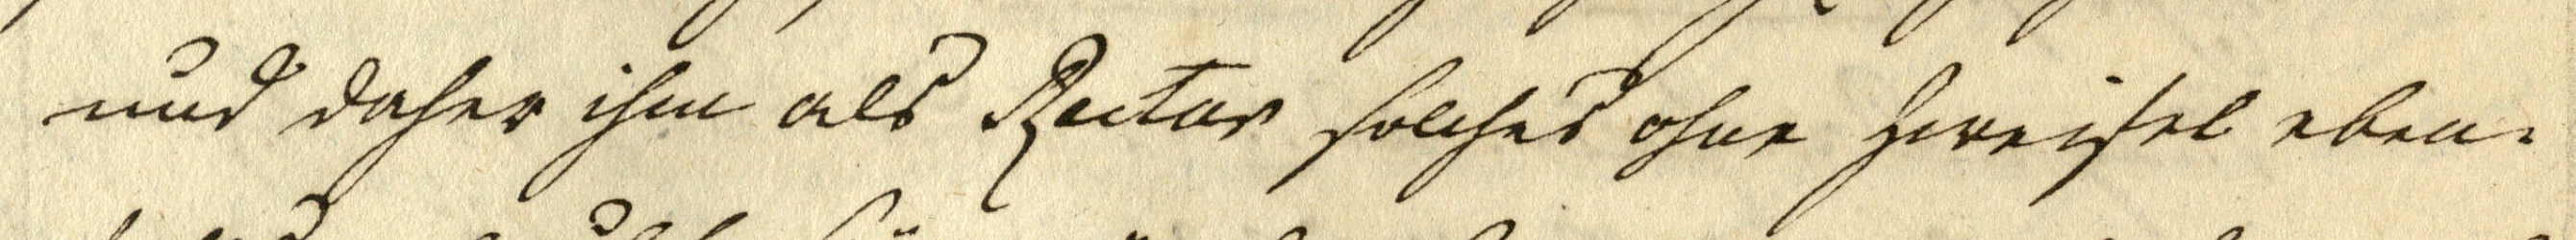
und daher ihm als Rector solches ohne Zweifel eben-
